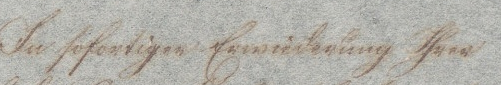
In sofortiger Erwiederung Ihrer
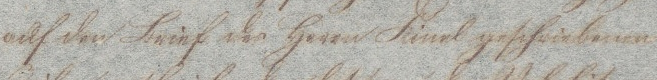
auf den Brief des Herrn Kinel geschriebenen
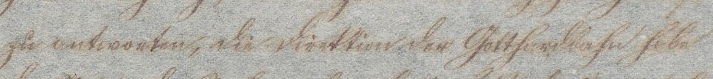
zu antworten, die Direktion der Gotthardbahn habe
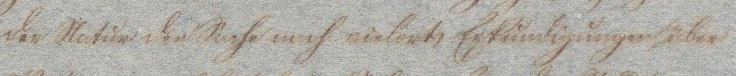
der Natur der Sache nach vielorts Erkundigungen über
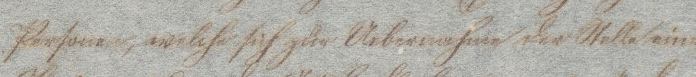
Personen, welche sich zur Uebernahme der Stelle eines
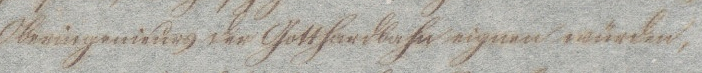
Oberingenieurs der Gotthardbahn eignen würden,
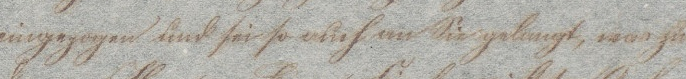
eingezogen und sei so auch an Sie gelangt, was zu
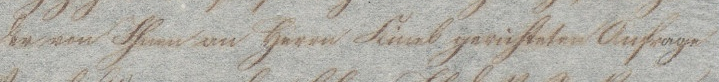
der von Ihnen an Herrn Kinel gerichteten Anfrage
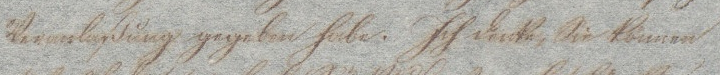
Veranlaßung gegeben habe. Ich denke, Sie können
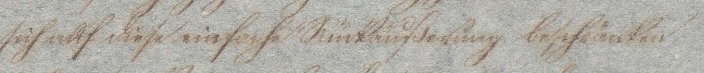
sich auf diese einfache Rückäußerung beschränken
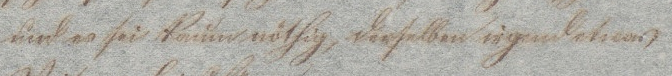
und es sei kaum nöthig, derselben irgendetwas
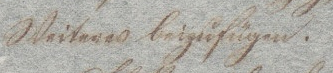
Weiteres beizufügen.
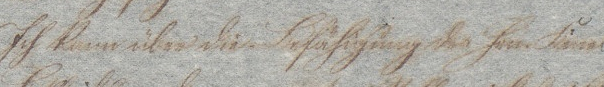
Ich kann über die Befähigung des Herrn Kinel
